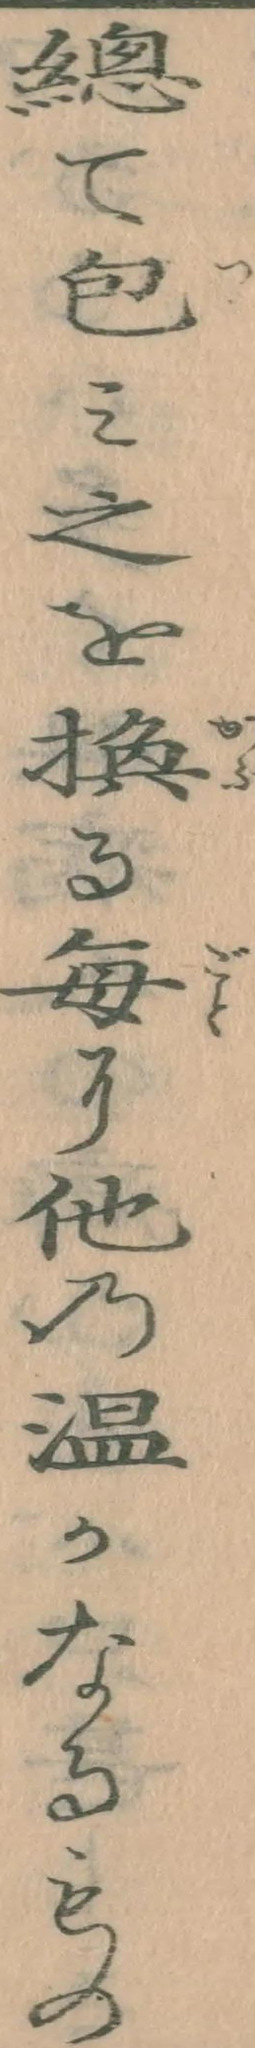総て包み之を換る毎に他の温かなるもの
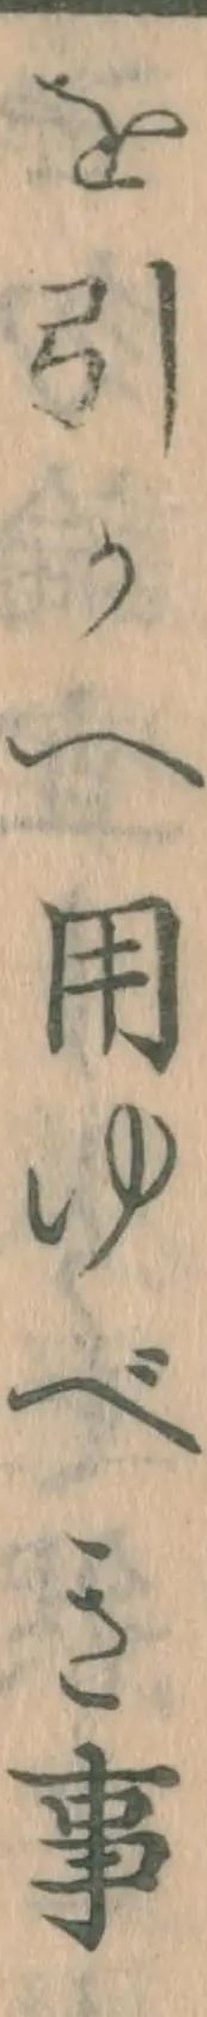を引かへ用ゆべき事
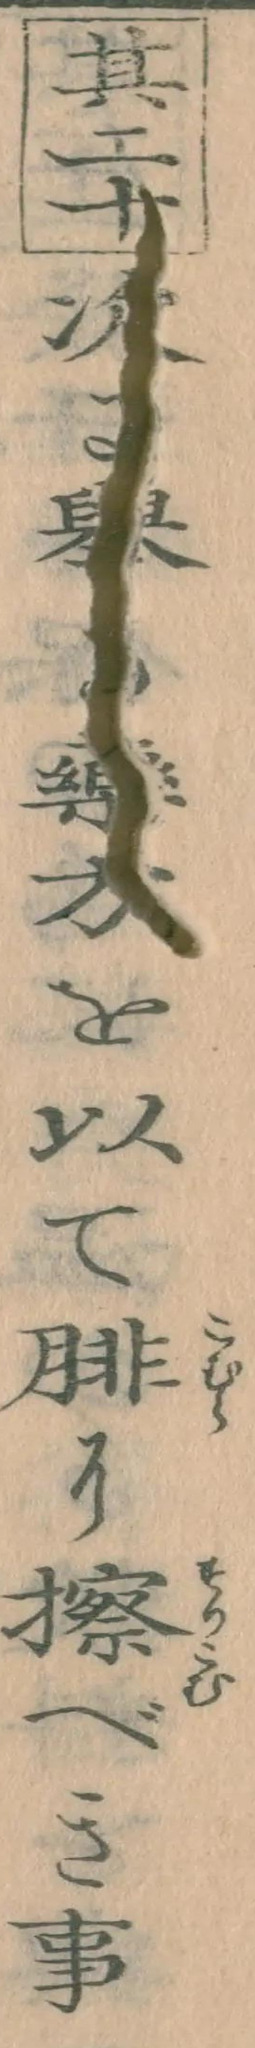其二十次に挙る薬方を以て腓に擦べき事

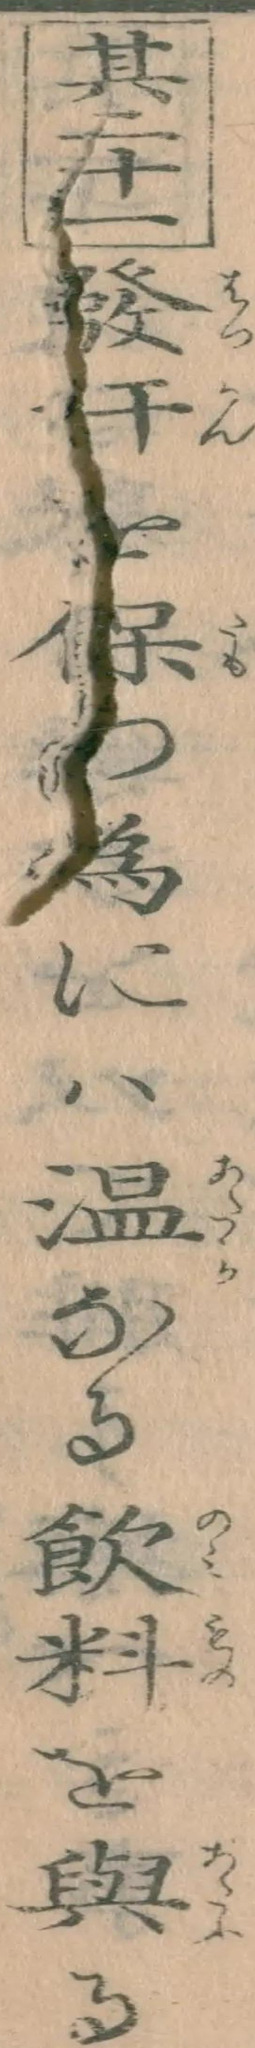其二十一発汗を保つ為には温なる飲料を与る
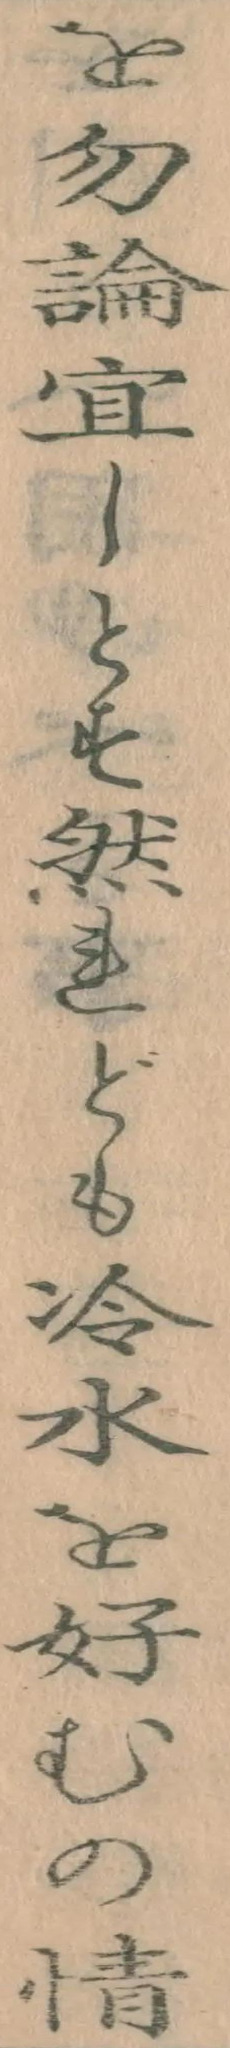を勿論宜しとす然れども冷水を好むの情
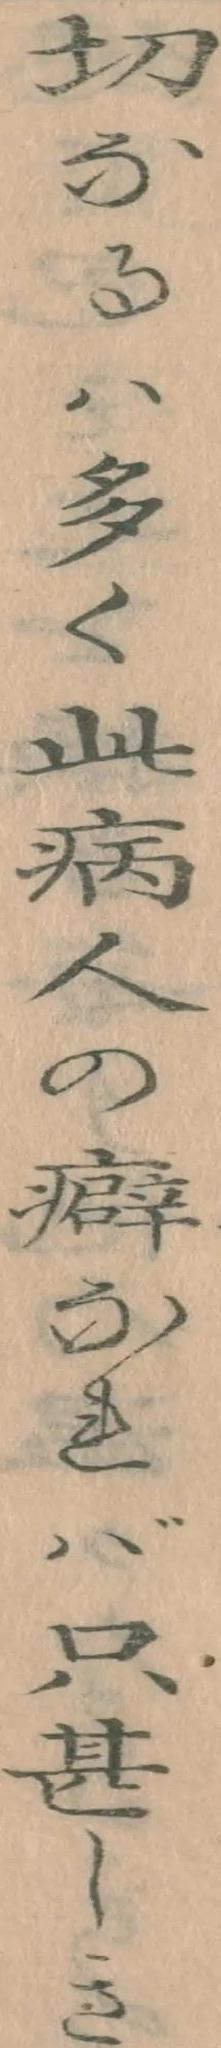切なるは多く此病人の癖なれば只甚しき
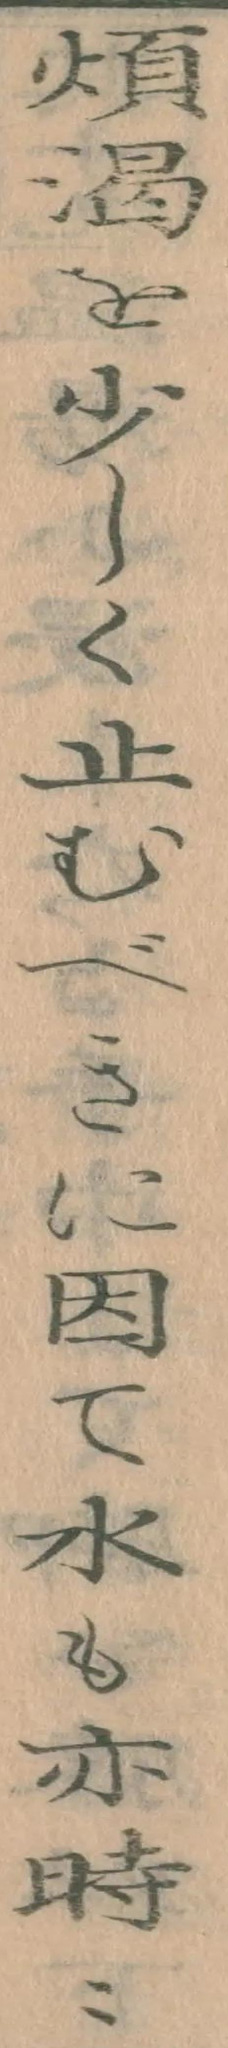煩渇を少しく止むべきに因て水も亦時々
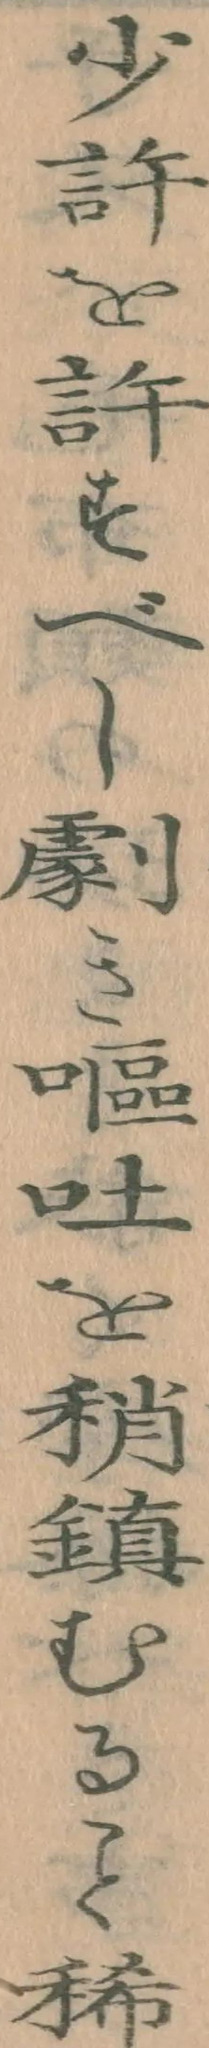少許を許すべし劇き嘔吐を稍鎮むること稀
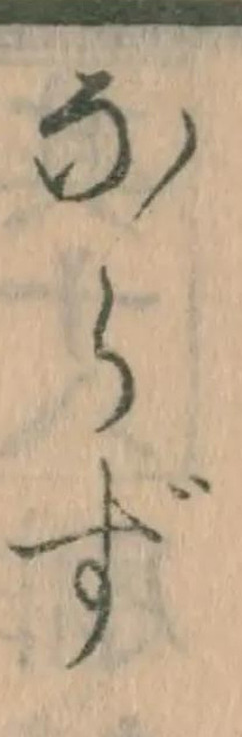ならず
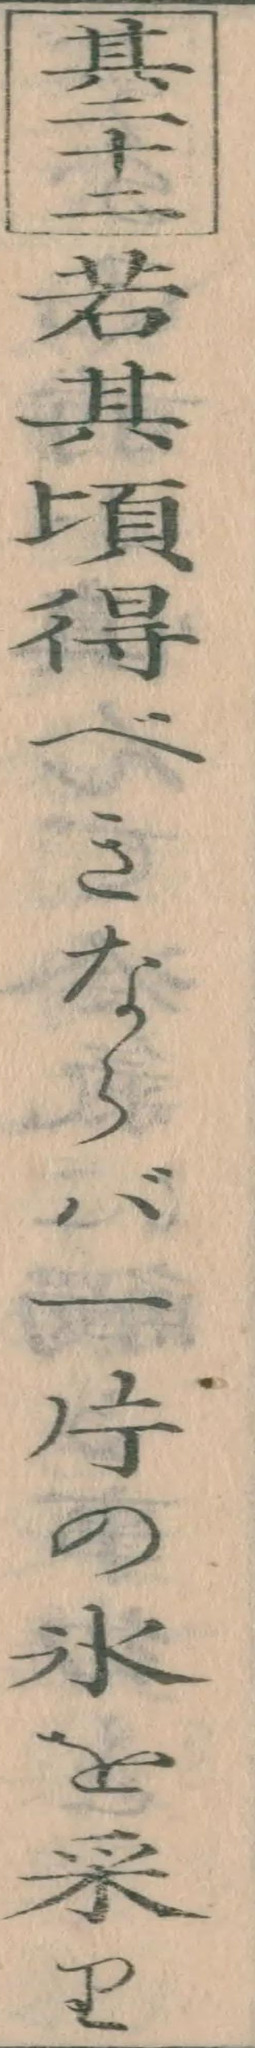其二十二若其頃得べきならば一片の氷を釆り
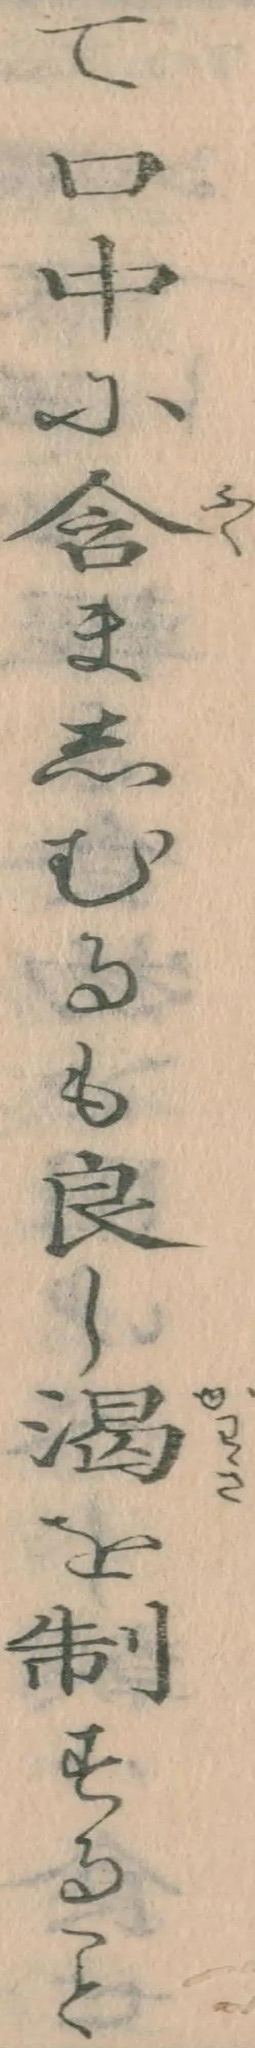て口中に含ましむるも良し渇を制すること
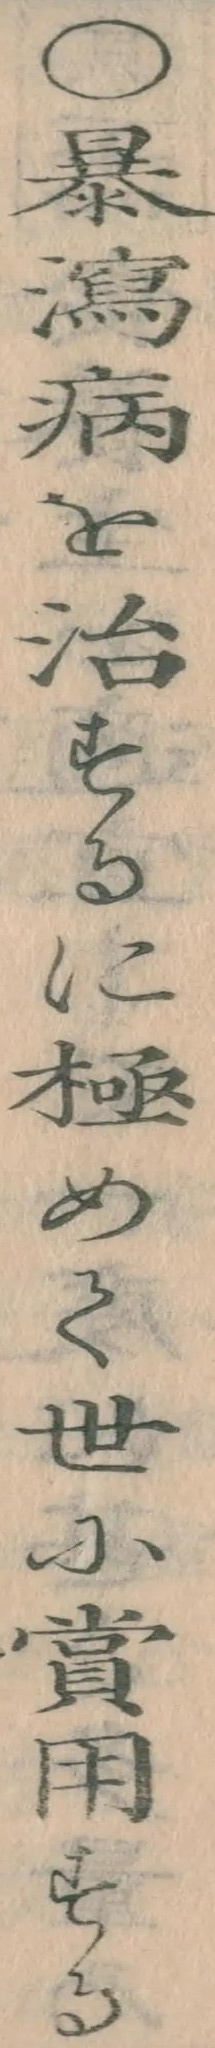〇暴瀉病を治するに極めて世に賞用する
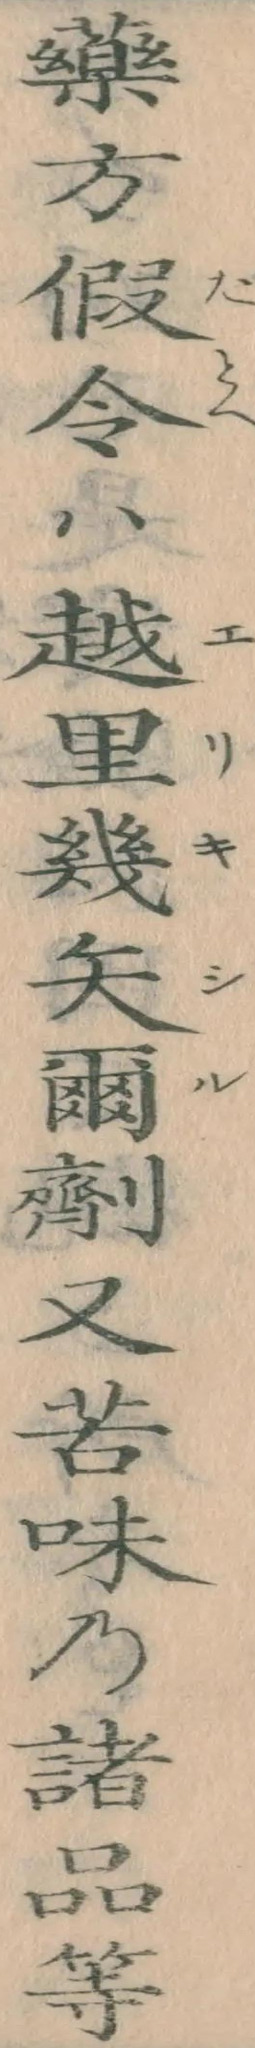薬方仮令は越里幾矢爾剤又苦味の諸品等
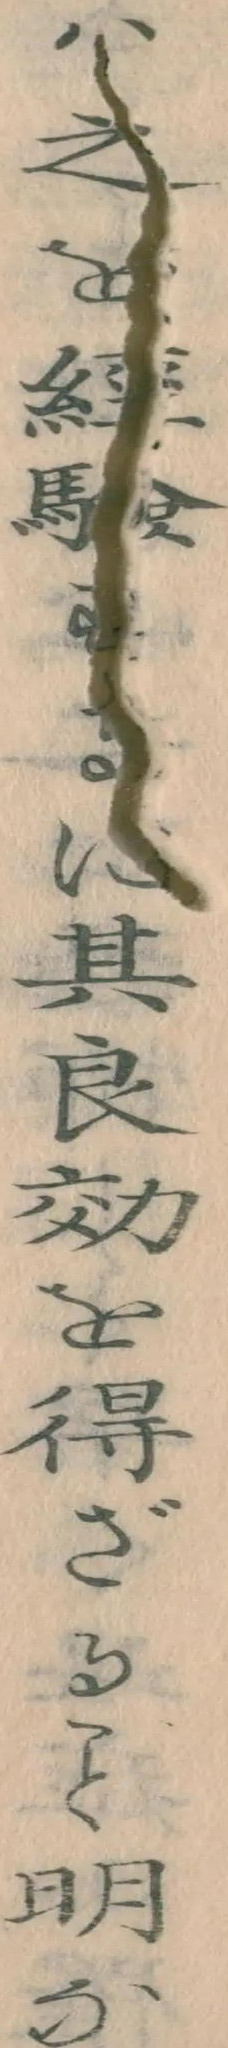は之を経験するに其良効を得ざること明な

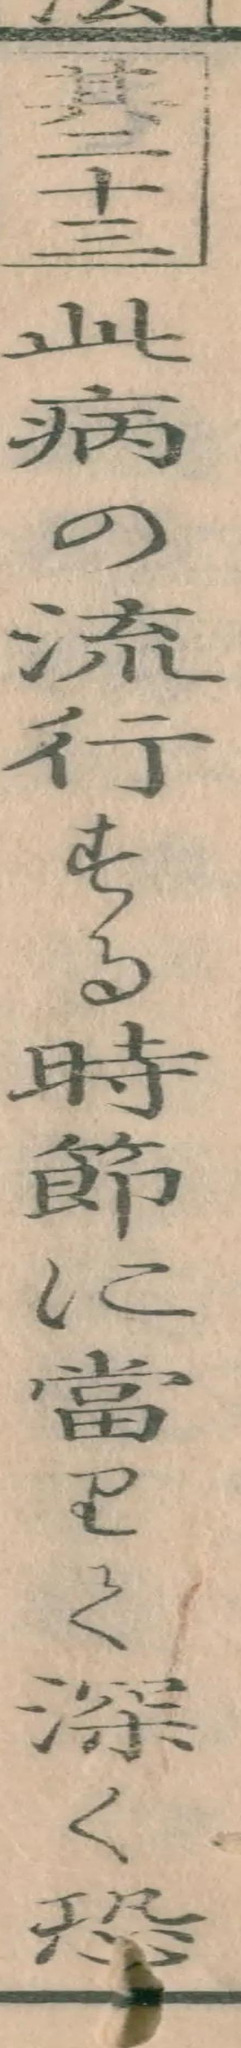預防法其二十三此病の流行する時節に当りて深く恐
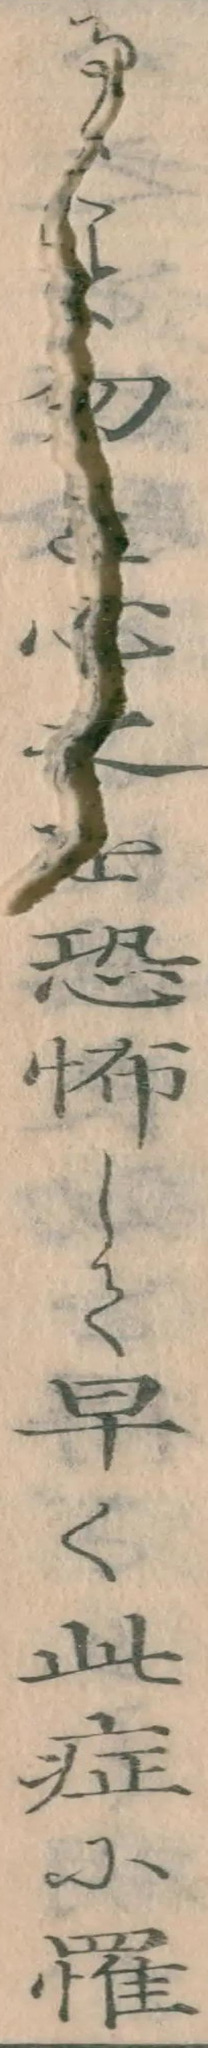るゝこと勿れ心之を恐怖して早く此症に罹
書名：暴瀉病手当素人心得書
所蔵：国立国会図書館 National Diet Library, JAPAN
